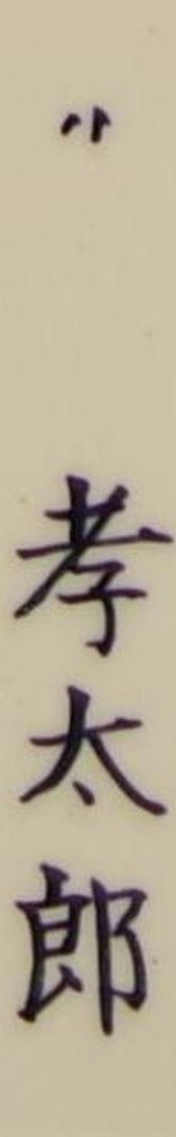孝太郎
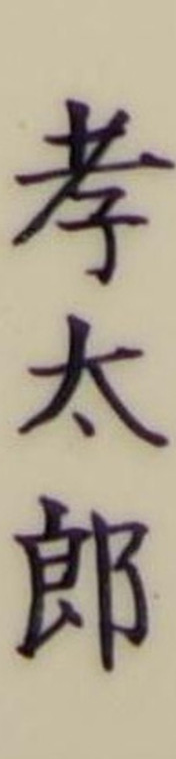孝太郎
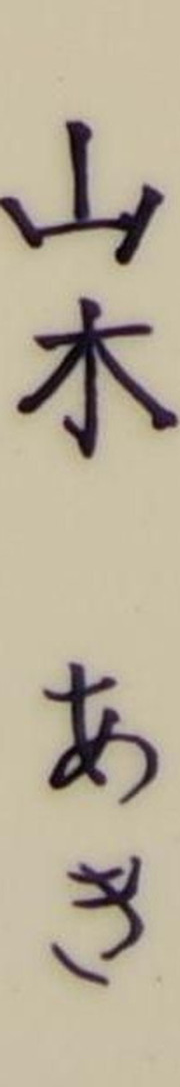山木あき
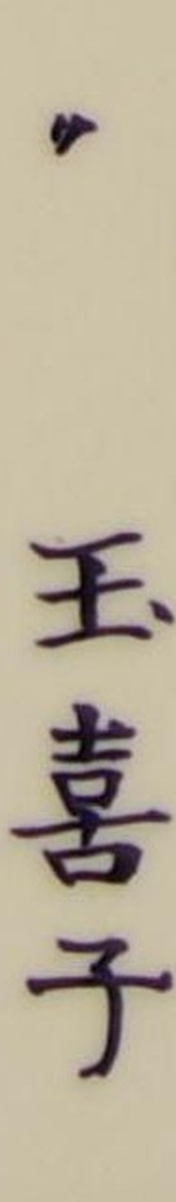玉喜子
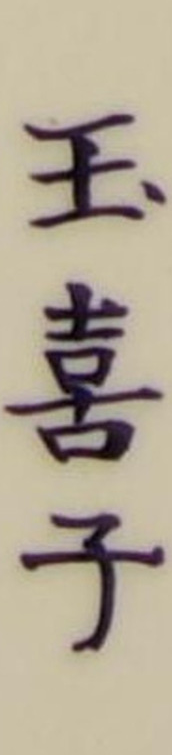玉喜子
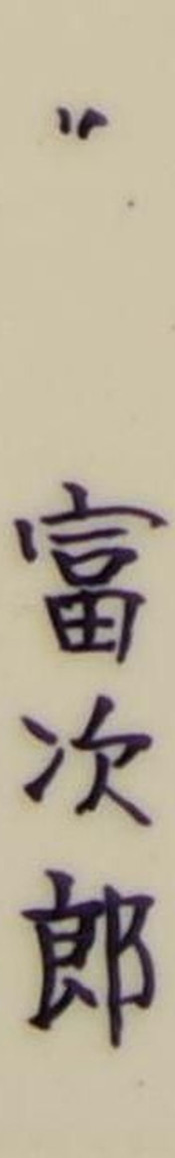富次郎
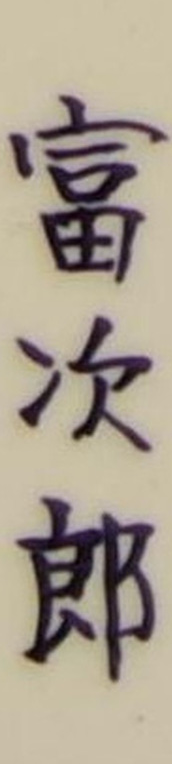富次郎

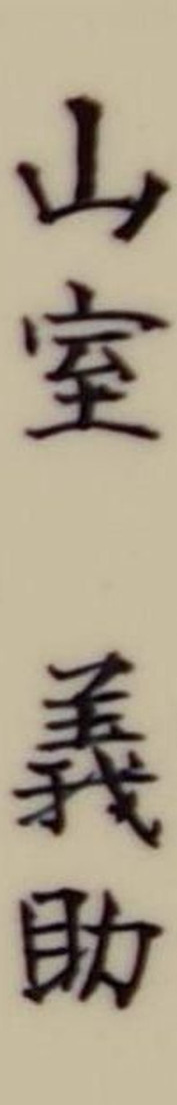山室義助
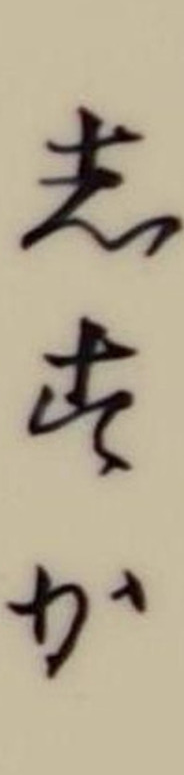しすか
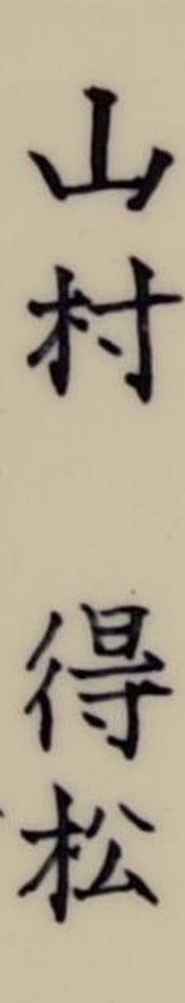山村得松
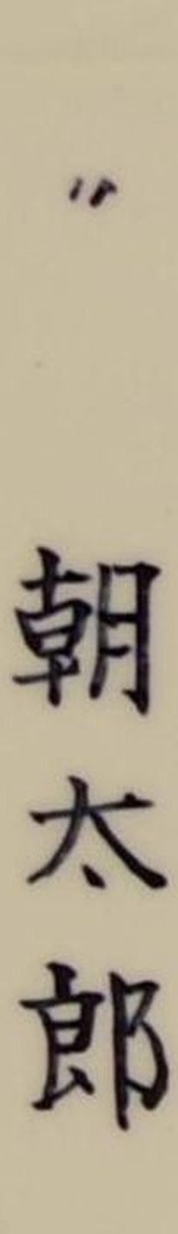朝太郎
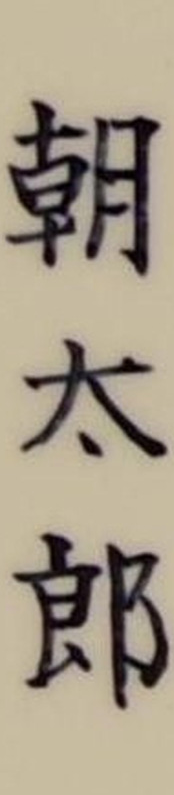朝太郎
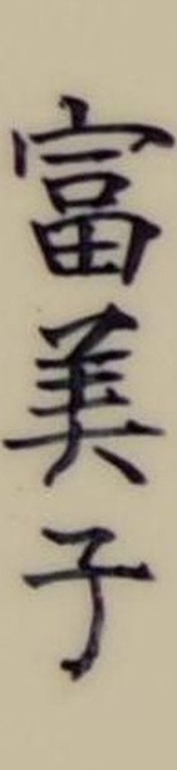富美子
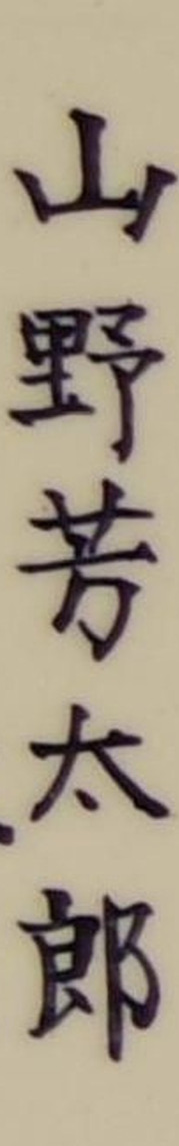山野芳太郎
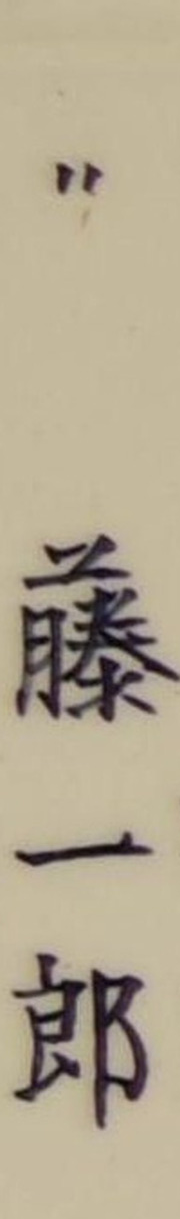藤一郎
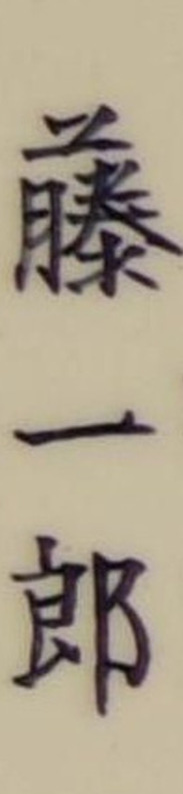藤一郎
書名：A~D
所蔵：koyasan kongobuji
